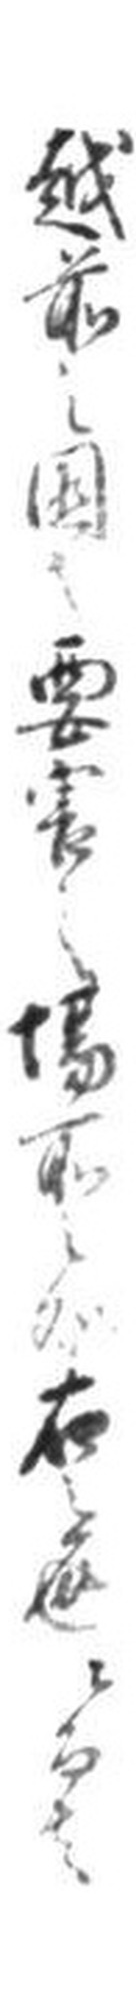越前之国者要害之場所之処右之通ニ而者
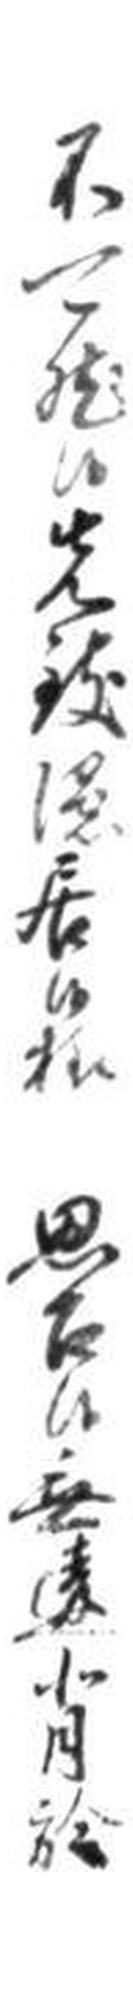不可然候先致隠居候様思召候無違背於
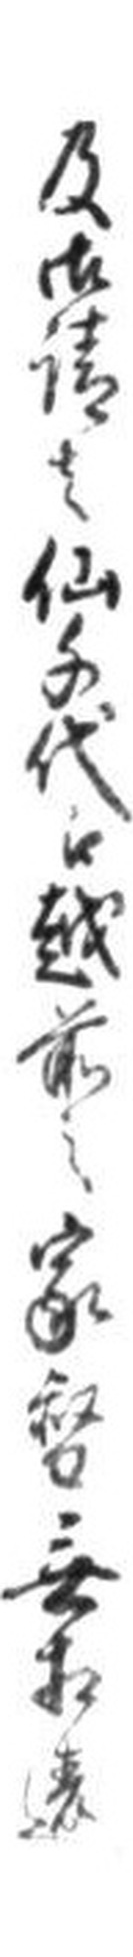及御請者仙千代江越前之家督無相違
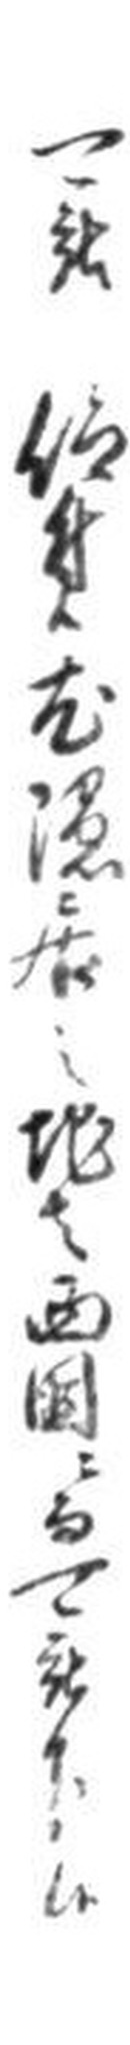可被仰付候尤隠居之地者西国ニ而可被下候
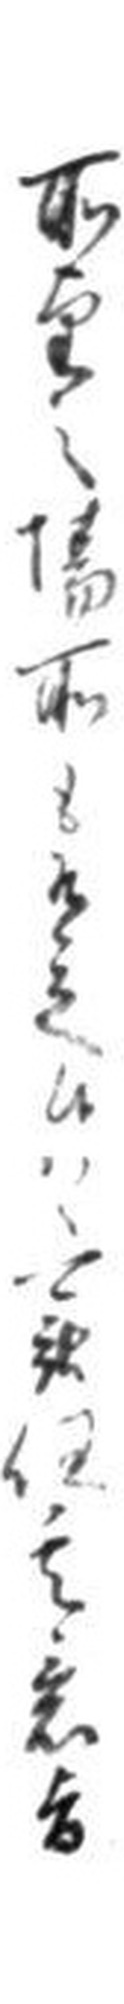所望之場所も有之候ハヽ可被任其意旨
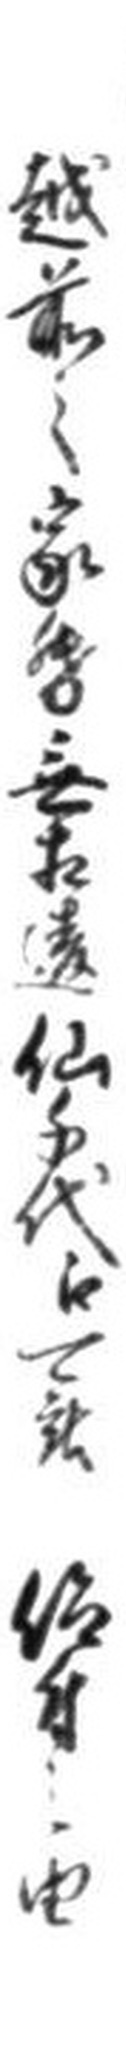越前之家督無相違仙千代江被仰付之由
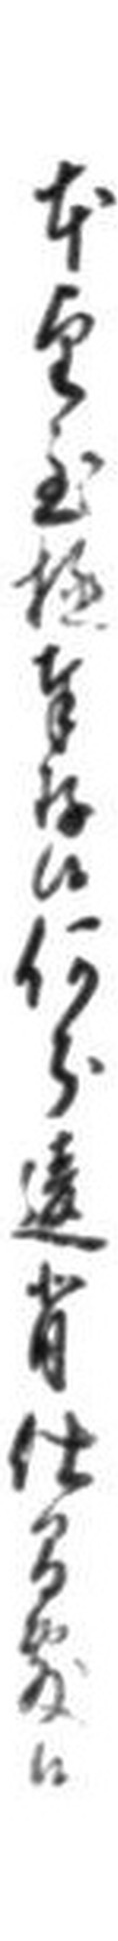本望至極奉存候何分違背仕間敷候
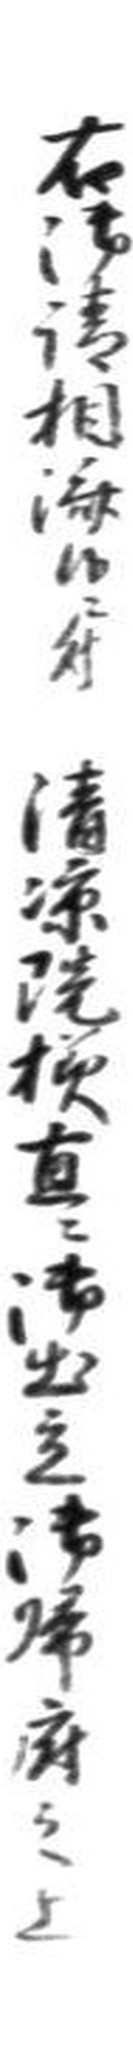右御請相済候ニ付清涼院様直ニ御出立御帰府之上
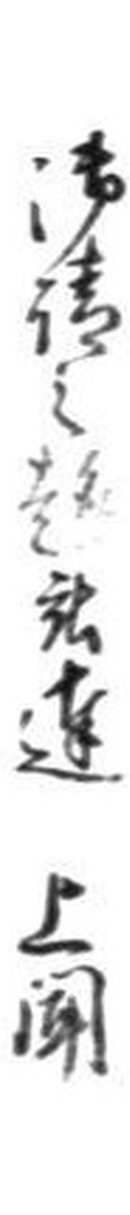御請之趣被達上聞
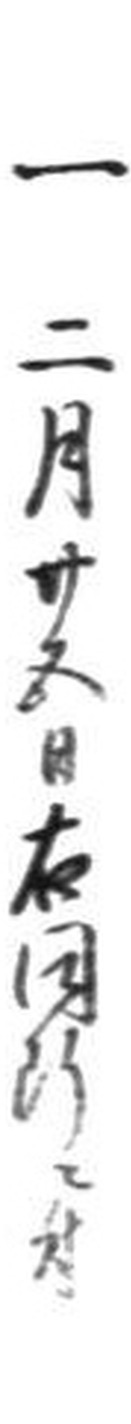一二月廿五日右同断ニ付
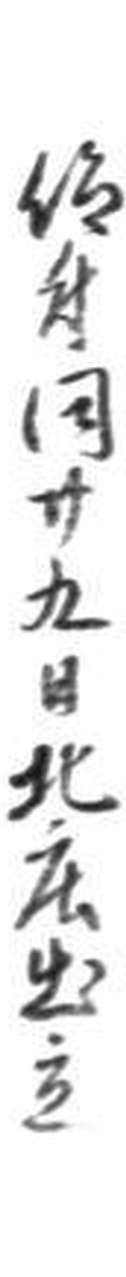仰付同廿九日北庄出立
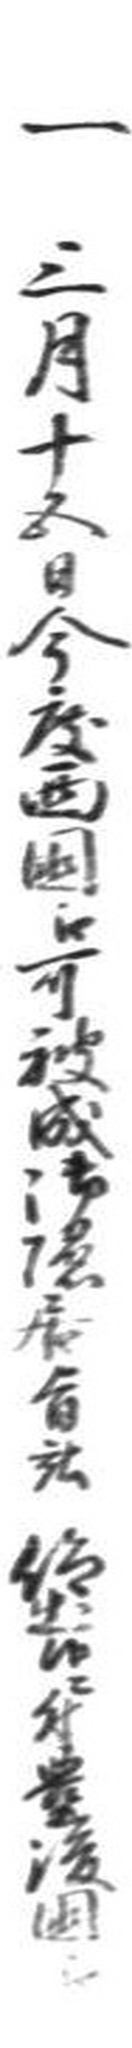一三月十五日今度西国江可被成御隠居旨被仰出候ニ付豊後国江
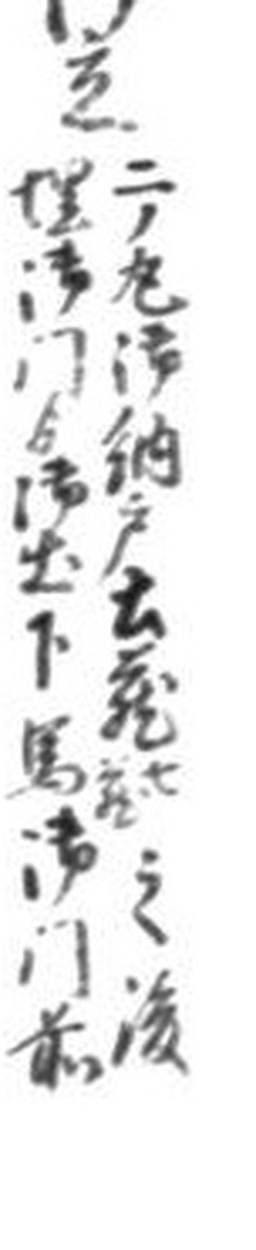埋御門ゟ御出下馬御門前

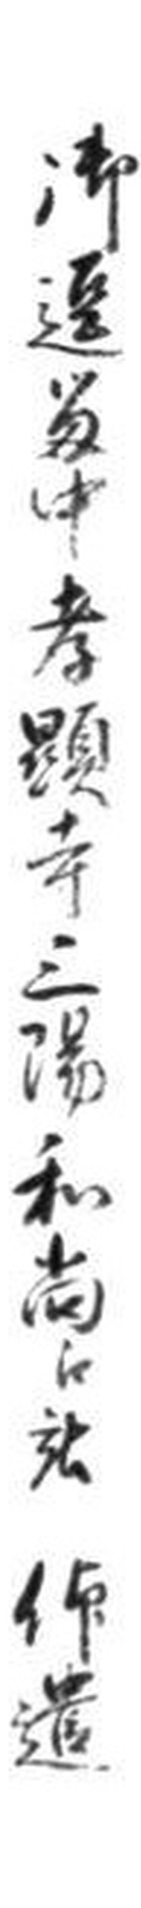御逗留中孝顕寺三陽和尚江被仰遣
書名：家譜 二 忠直公 従文禄四年到慶安四年
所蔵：福井県文書館 Fukui Prefectural Archives
